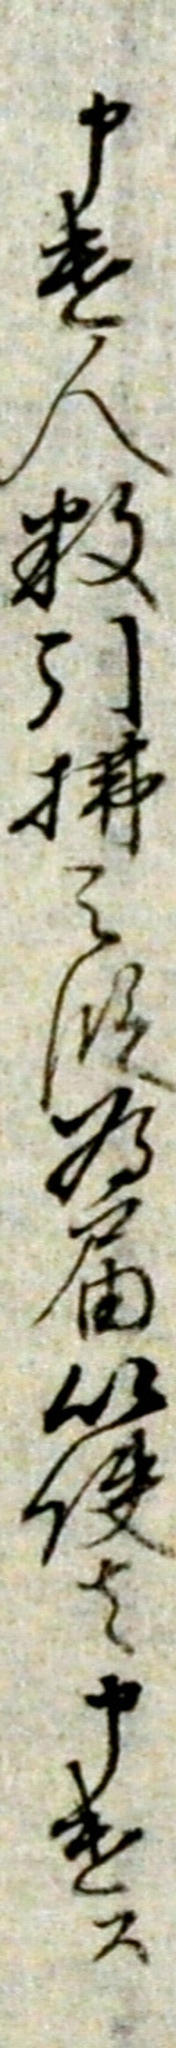申遣人数引払之段為届以使者申遣ス
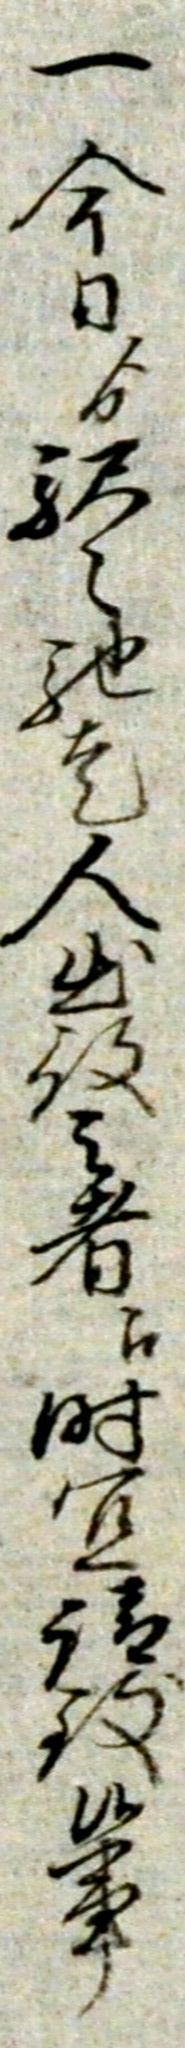一今日ゟ駅々馳走人出役之者江時宜請致候事
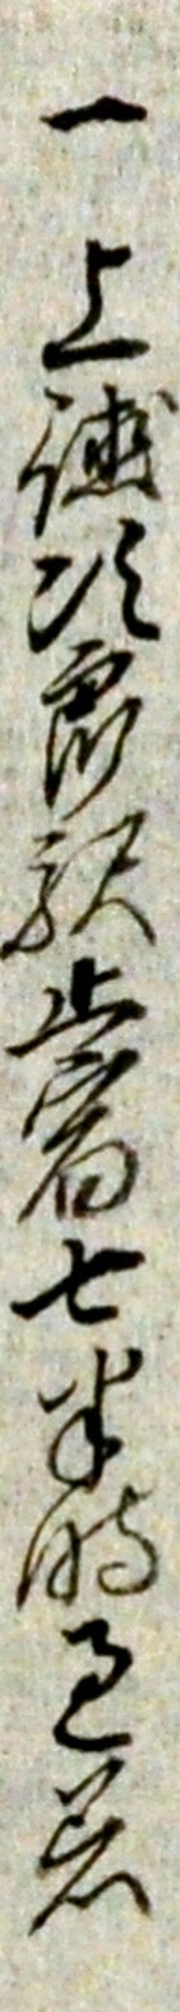一上徳次郎駅止宿七半時過着
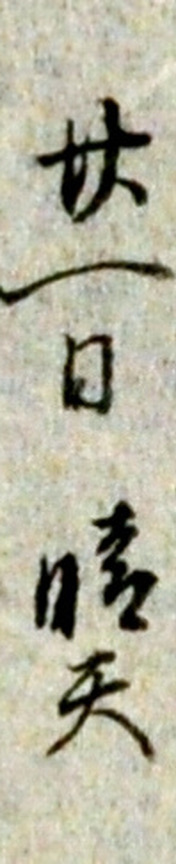廿一日晴天
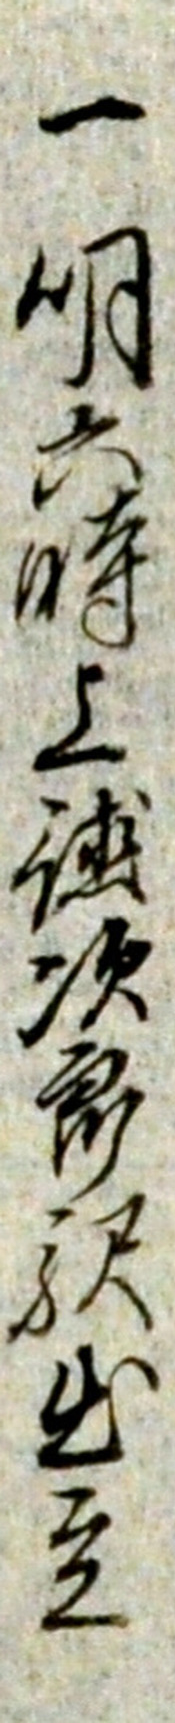一明六時上徳次郎駅出立
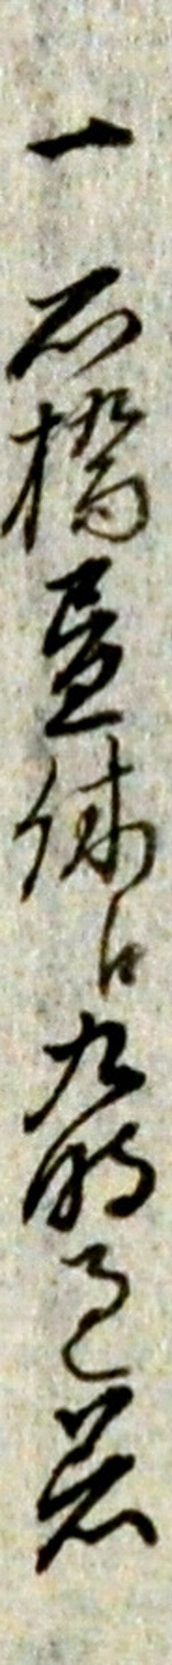一石橋昼休江九時過着
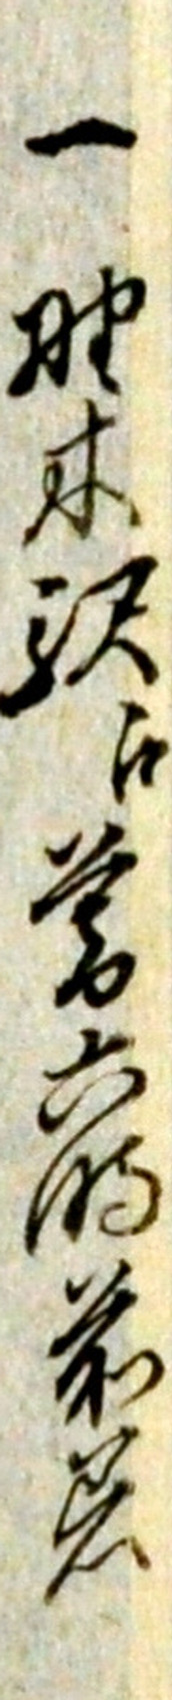一野木駅江暮六時前着
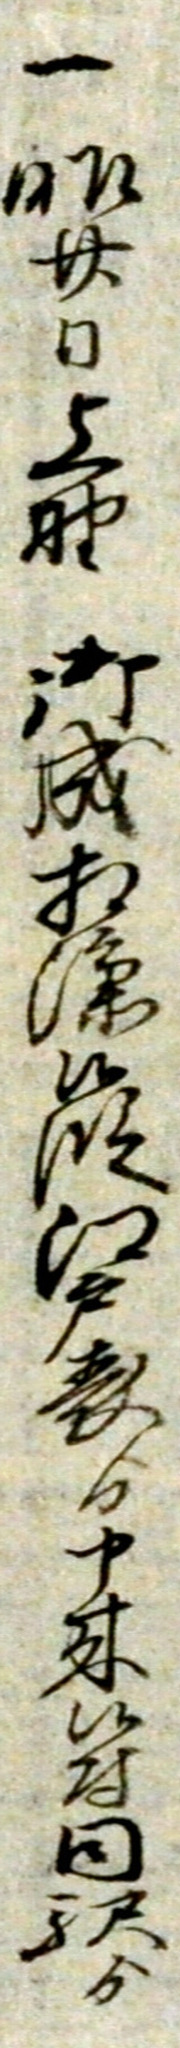一昨廿日上野御成相済候段江戸表ゟ申来候付同駅ゟ
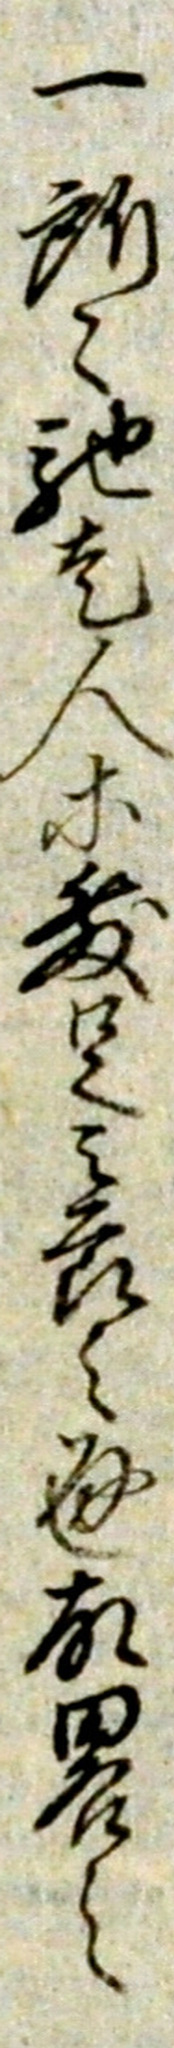一所々馳走人等敷足其節之通故略之
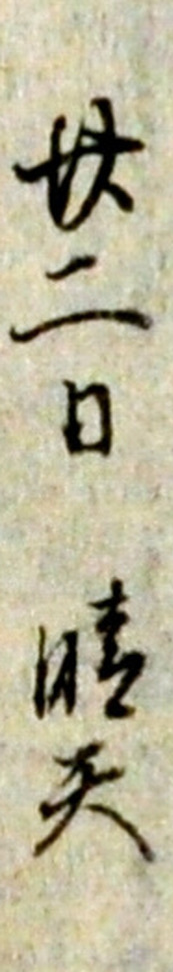廿二日晴天
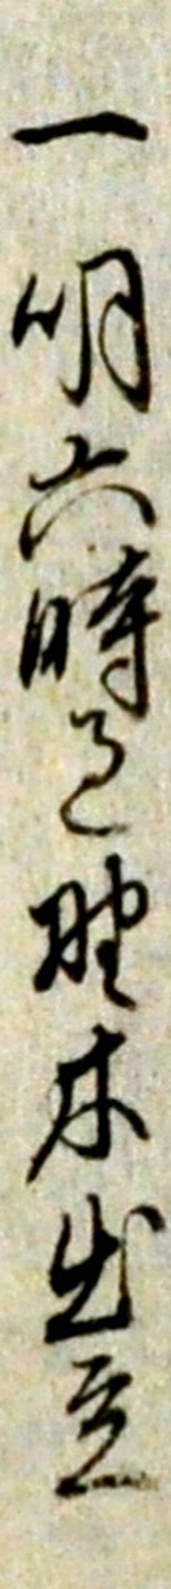一明六時過野木出立
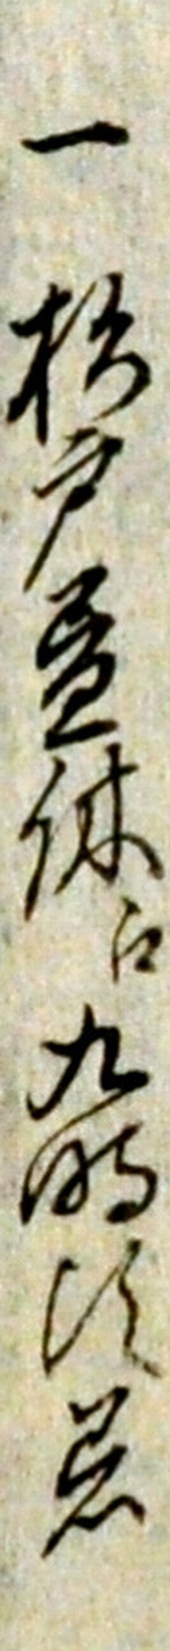一杉戸昼休江九時頃着
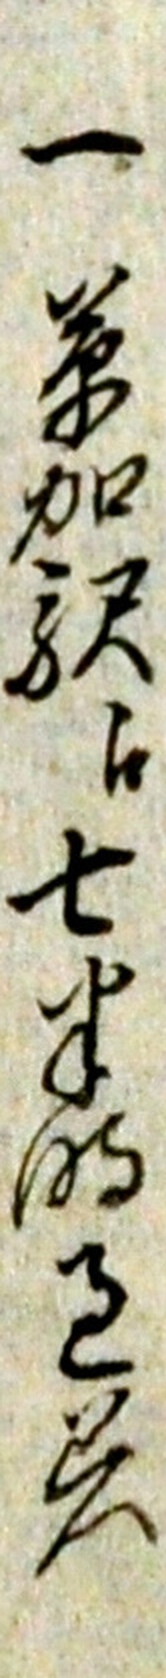一草加駅江七半時過着
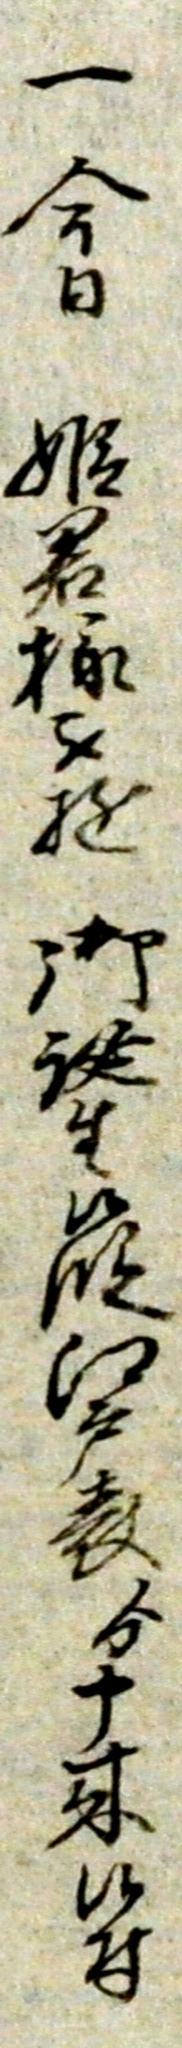一今日姫君様被遊御誕生候段江戸表ゟ申来候付
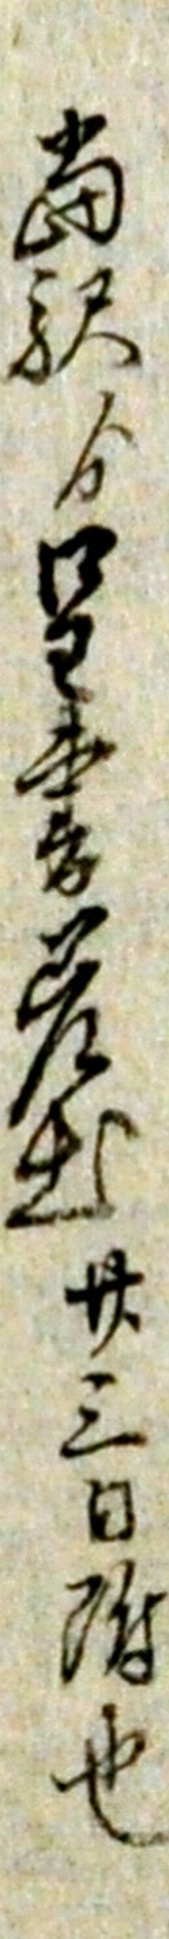当駅ゟ呈書差出廿三日附也
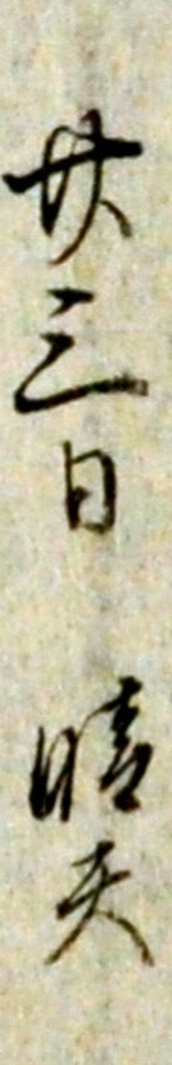廿三日晴天
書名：日光御名代相勤候節ノ留
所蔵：伊那市立高遠町図書館・合同会社AMANE
